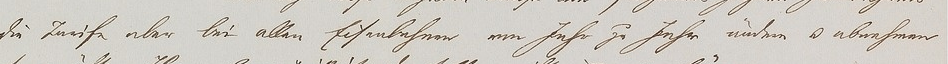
die Tarife aber bei allen Eisenbahnen von Jahr zu Jahr ändern & abnehmen
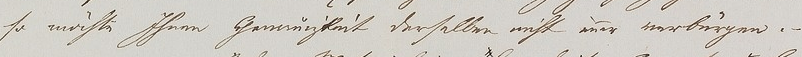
so möchte Ihnen Genauigkeit derselben nicht immer verbürgen. –
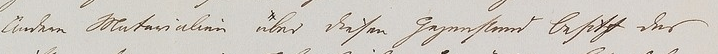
Andere Materialien über diesen Gegenstand besitzt das
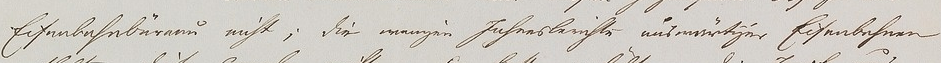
Eisenbahnbüreau nicht; die wenigen Jahresberichte auswärtiger Eisenbahnen
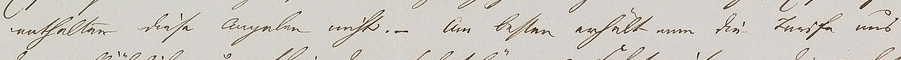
enthalten diese Angaben nicht. – Am besten erhält man die Tarife aus
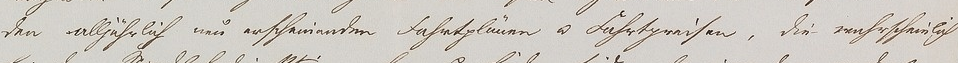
den alljährlich neu erscheinenden Fahrtplänen & Fahrtpreisen, die wahrscheinlich
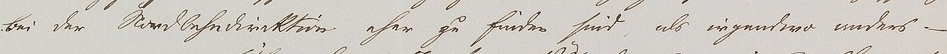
bei der Nordbahndirektion eher zu finden sind, als irgendwo anders. –
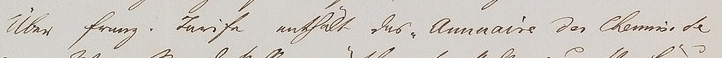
Über franz. Tarife enthält das «Annuaire des Chemins de
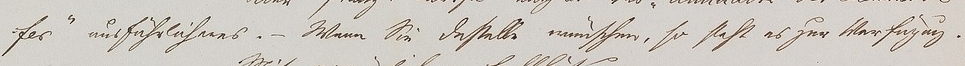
fer» ausführlicheres. – Wenn Sie dasselbe wünschen, so steht es zur Verfügung.
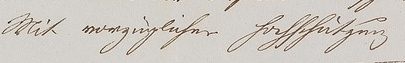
Mit vorzüglicher Hochschätzung
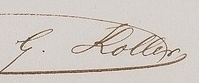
G. Koller
